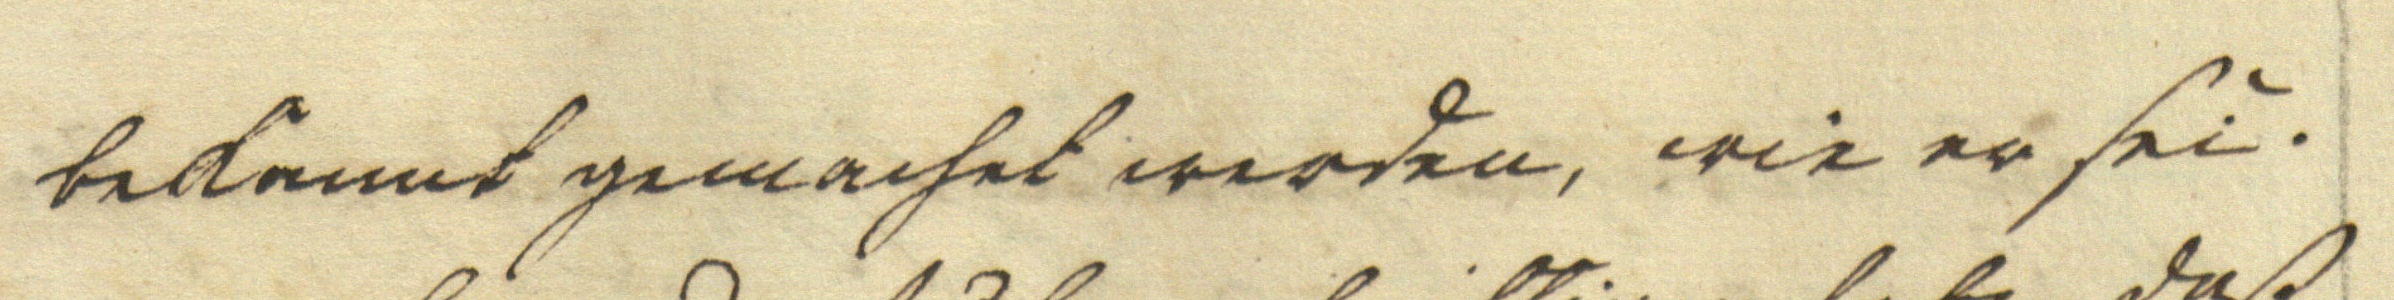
bekannt gemachet werden, wie er sei¬
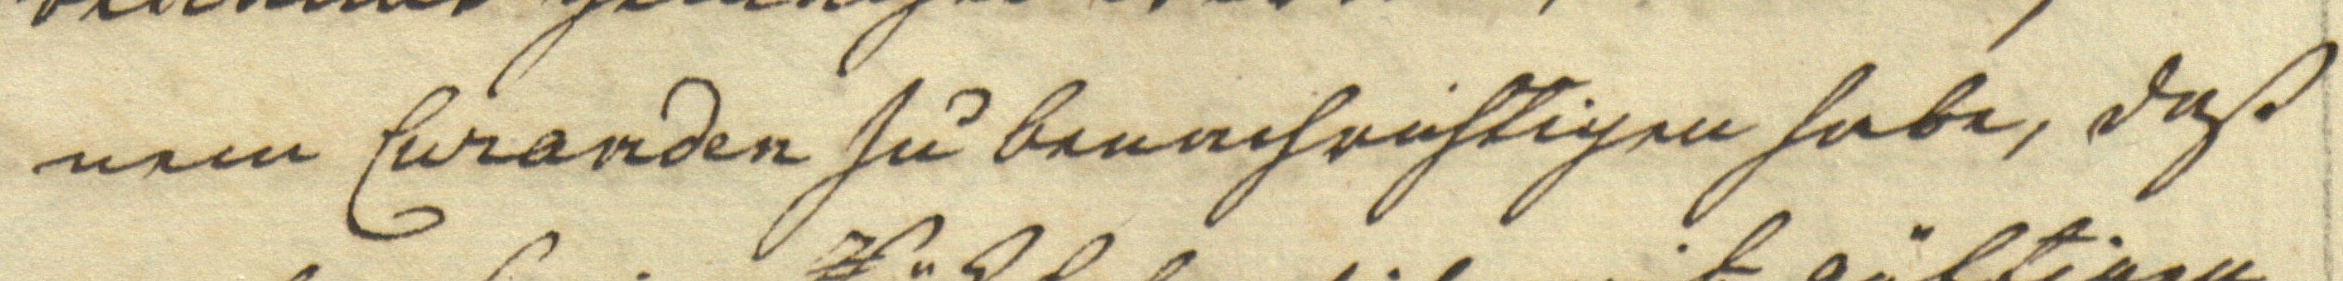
nem Curanden zu benachrichtigen habe, daß
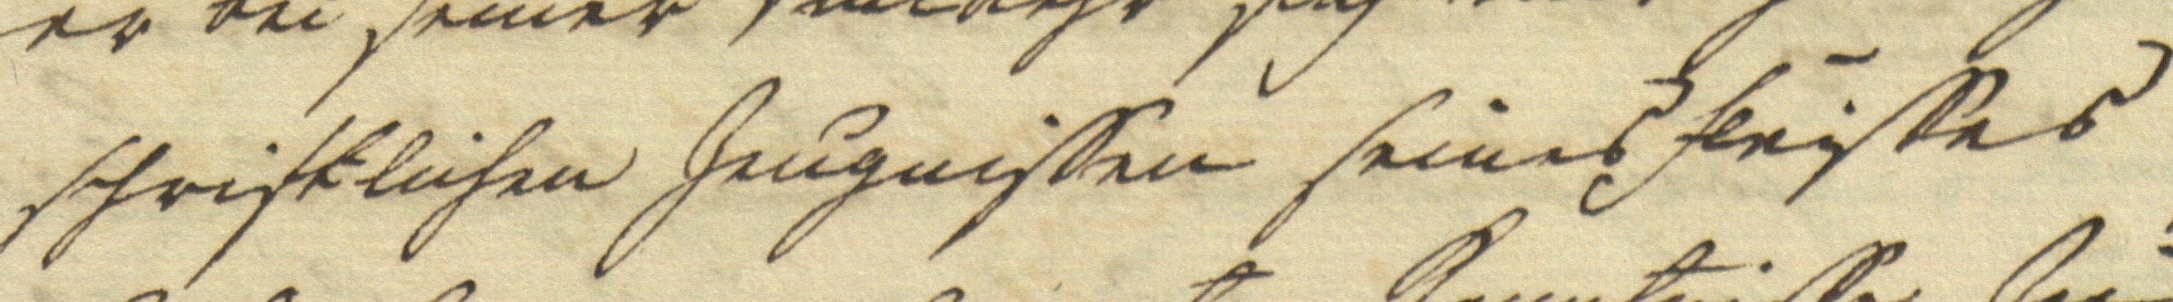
schriftlichen Zeugnissen seines Fleisses
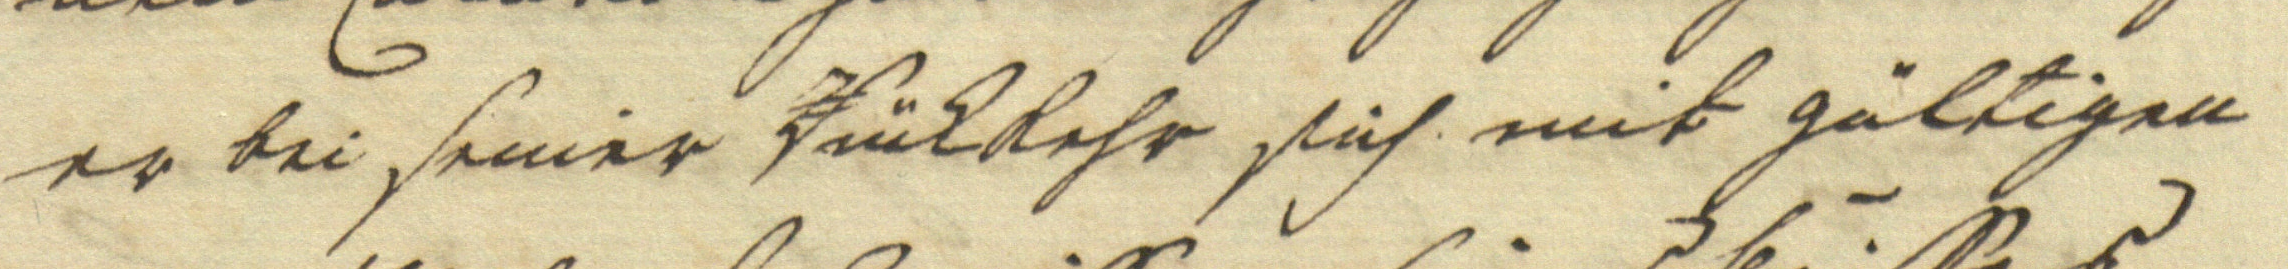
er bei seiner Rückkehr sich mit gültigen
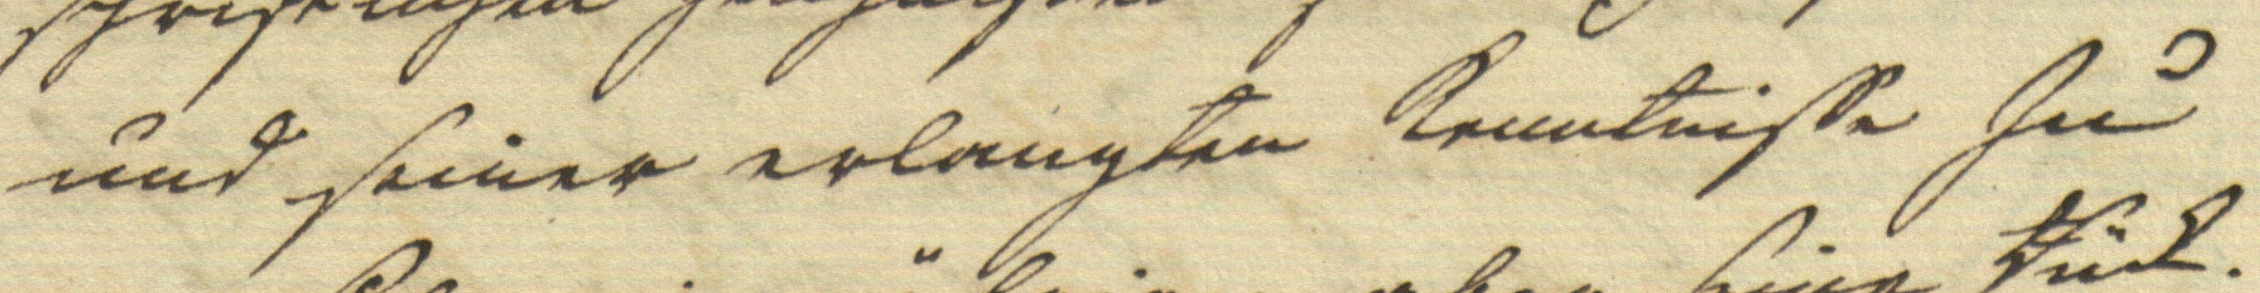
und seiner erlangten Kenntnisse zu
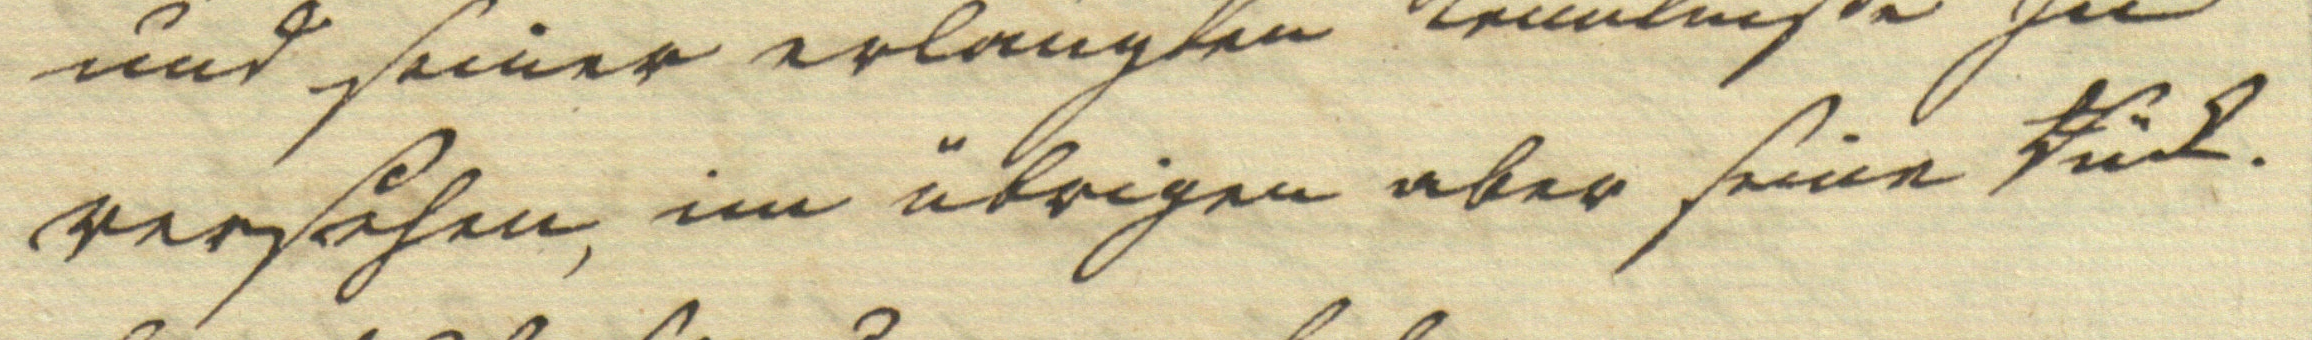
versehen, im übrigen aber seine Rück¬
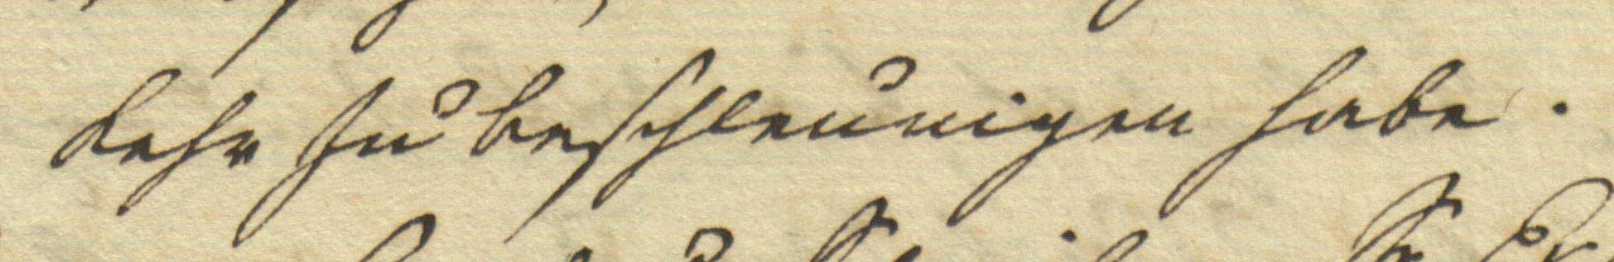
kehr zu beschleunigen habe.
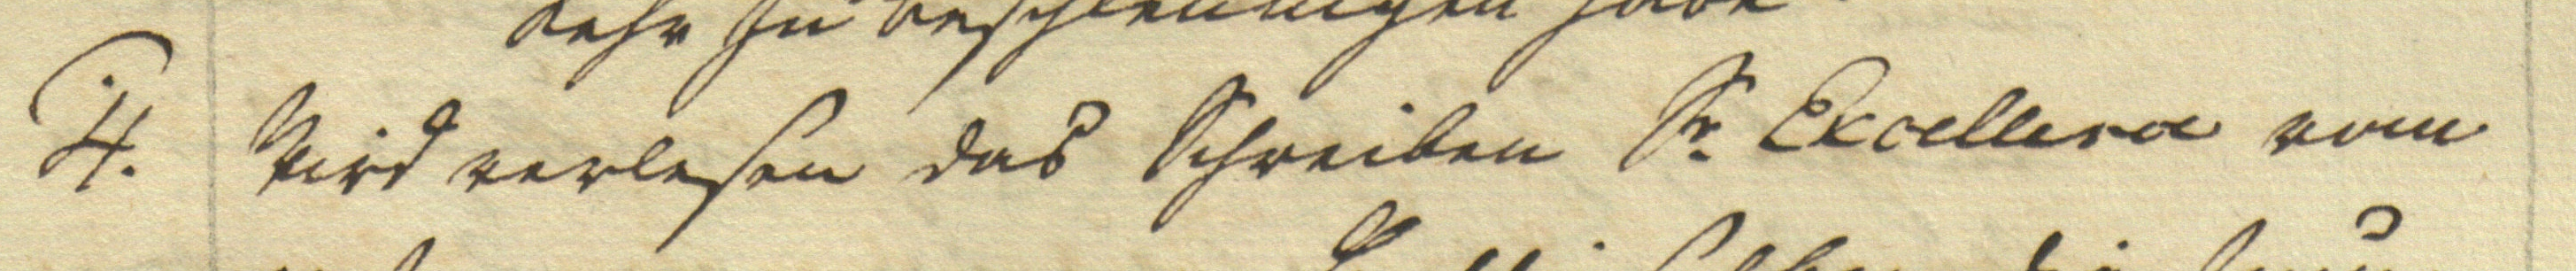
4. Wird verlesen das Schreiben Sr Excellence vom
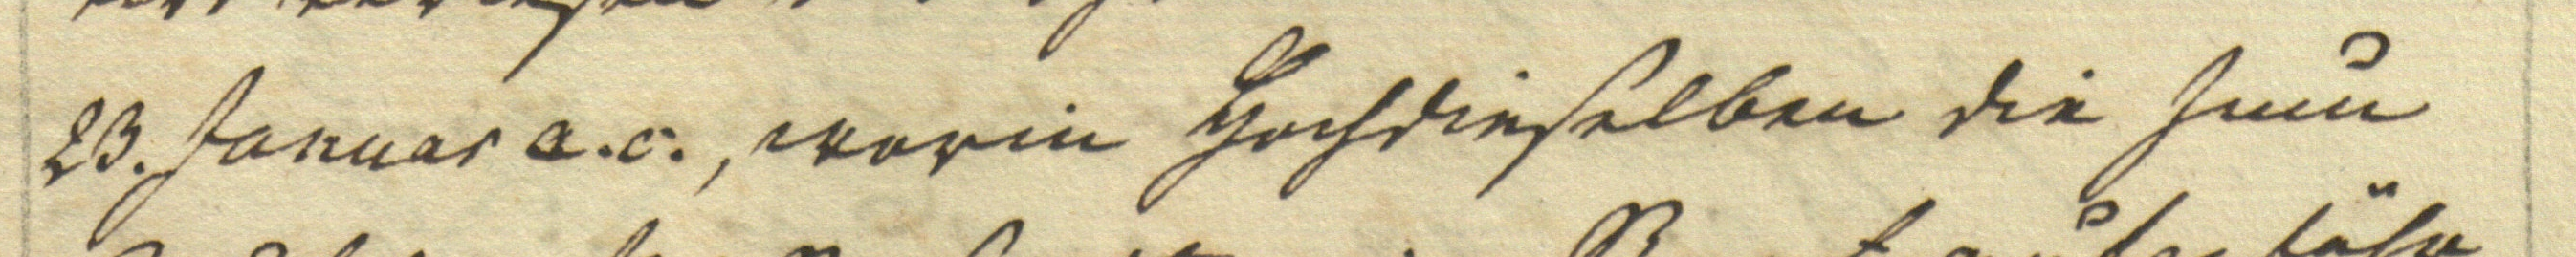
23. Januar a. c., worin Hochdieselben die zum
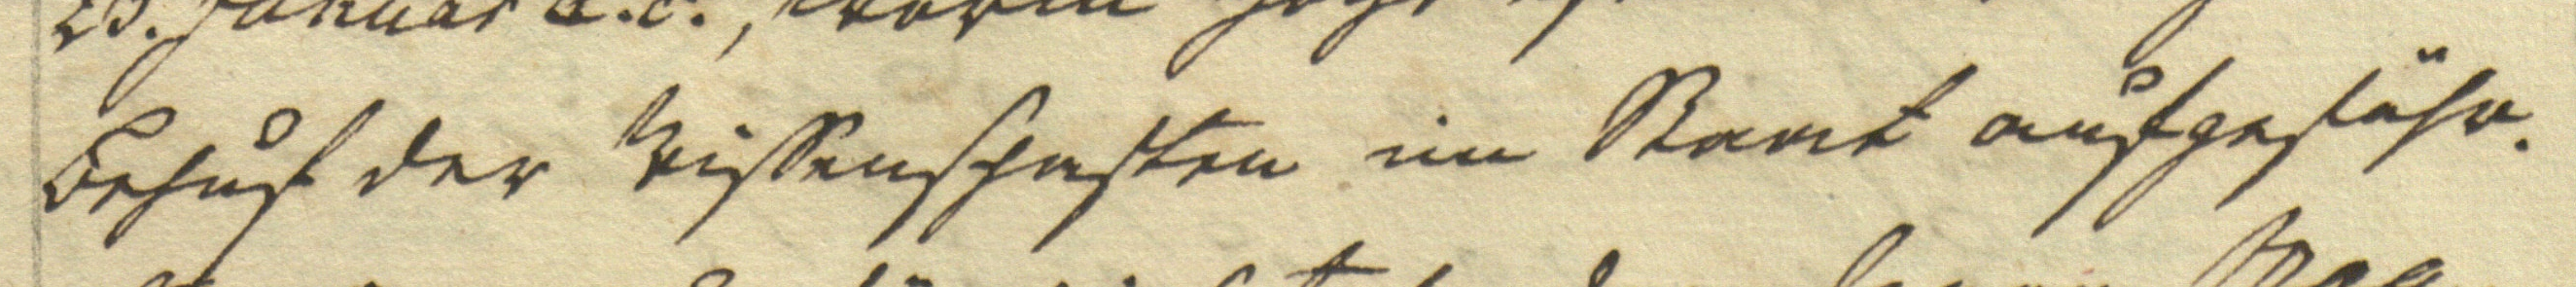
Behuf der Wissenschaften in Staat aufgeführ¬
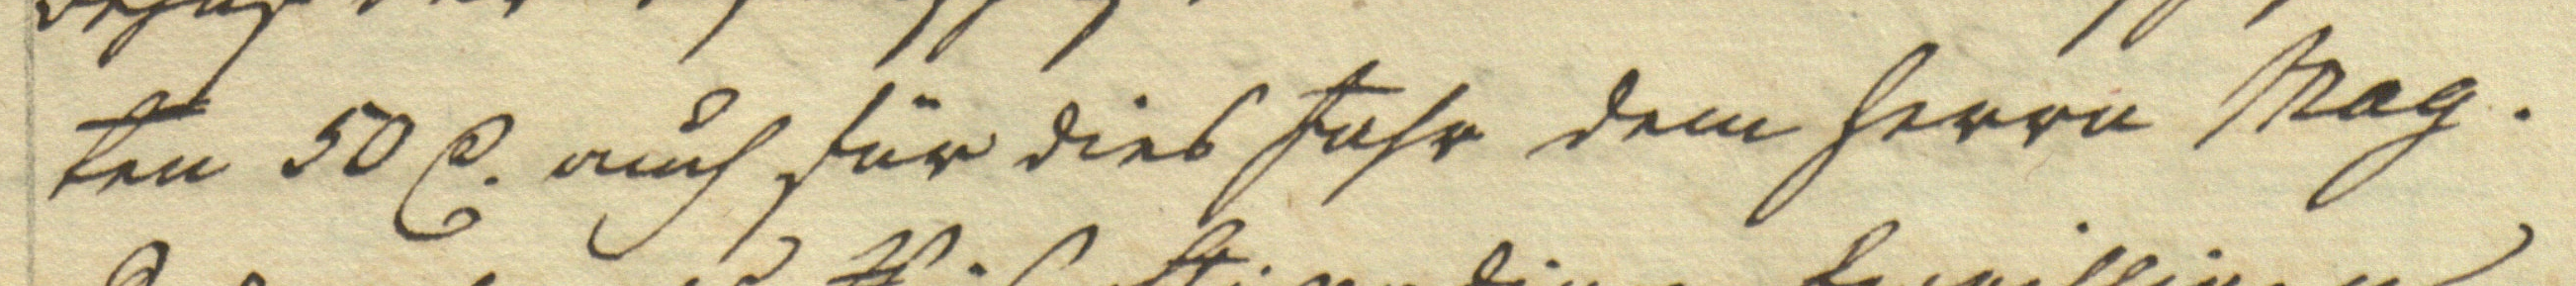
ten 50 l. auch für dies Jahr dem Herrn Mag.
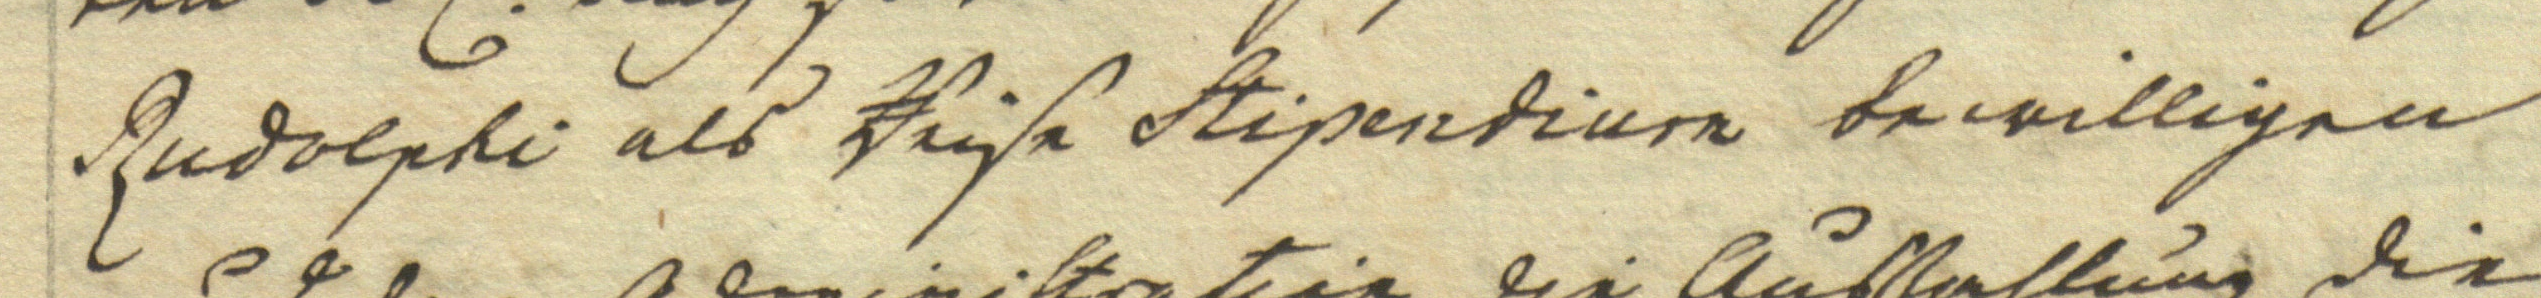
Rudolphi als Reise Stipendium bewilligen
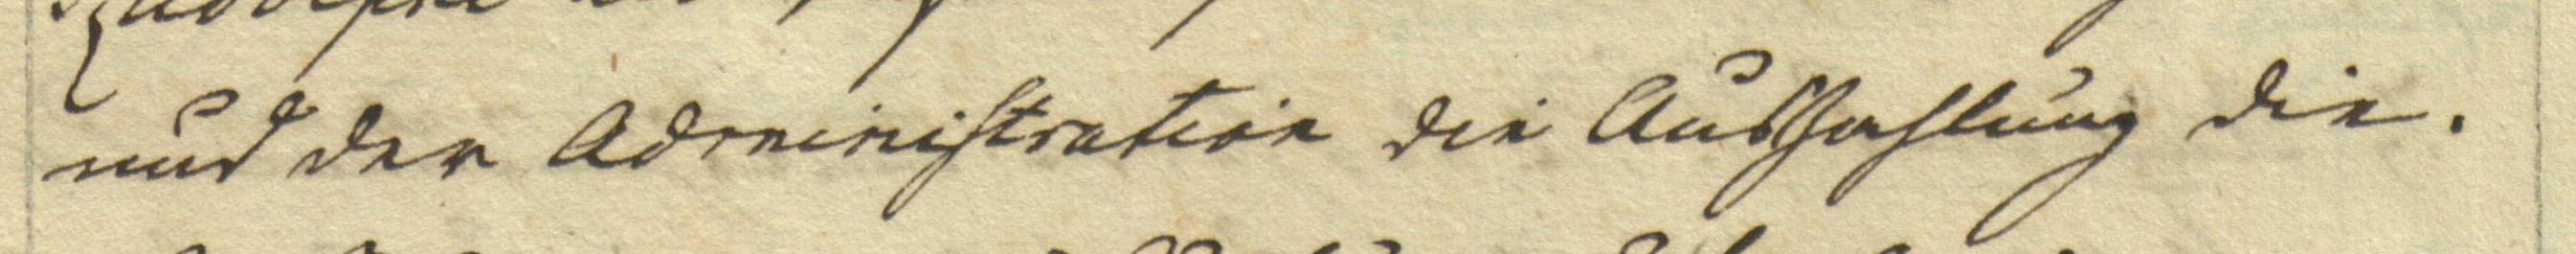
und der Administration die Auszahlung die¬
